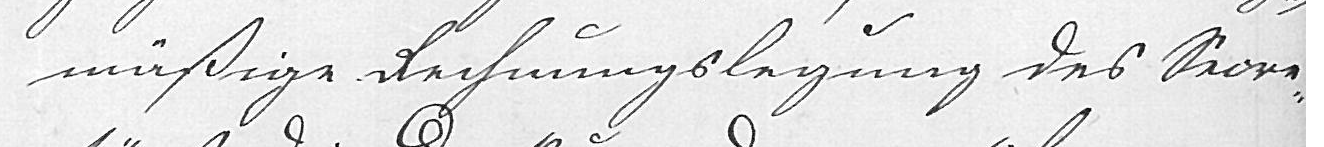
mäßige Rechungslegung des Secre-
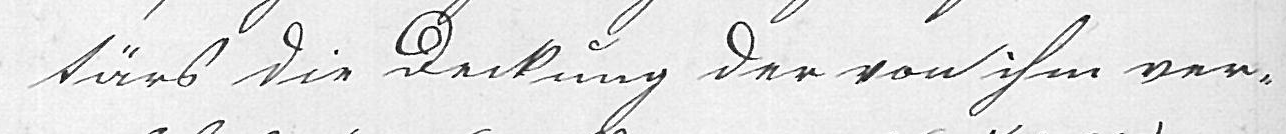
tärs die Deckung der von ihm ver-
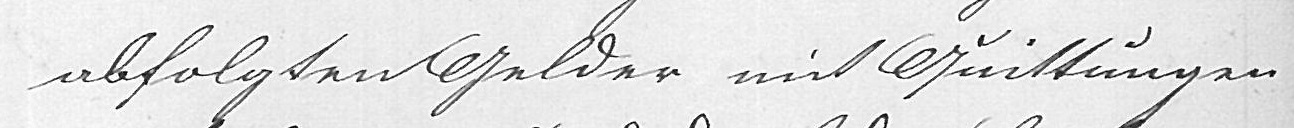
abfolgten Gelder mit Quittungen
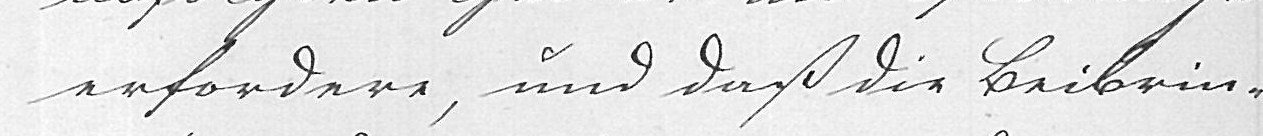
erfordere, und daß die Beibrin-
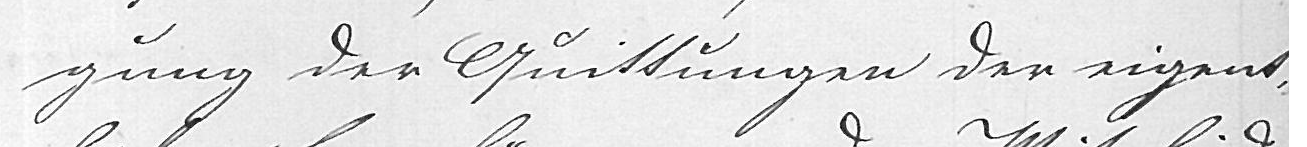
gung der Quittungen der eigent-
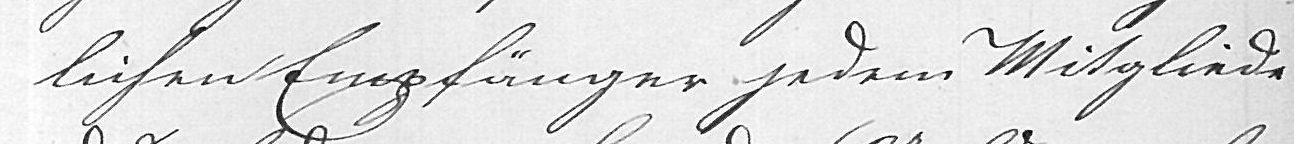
lichen Empfänger jedem Mitgliede
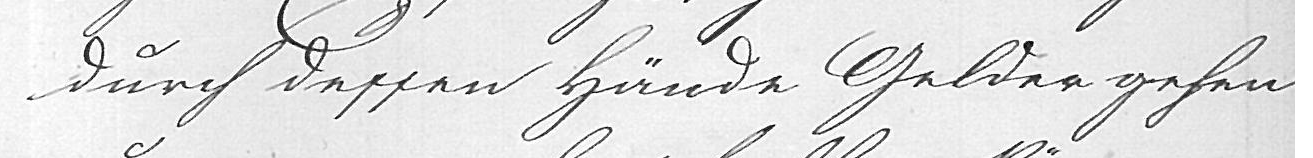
durch dessen Hände Gelder gehen
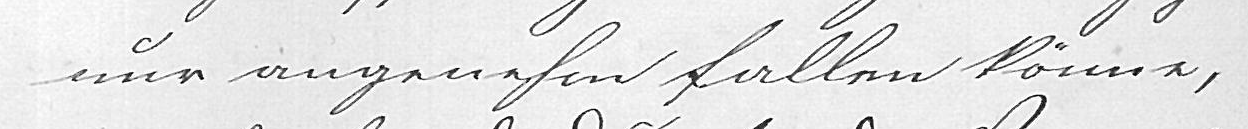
nur angenehm fallen könne,
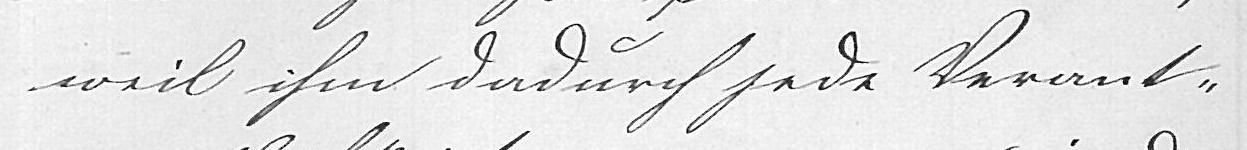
weil ihm dadurch jede Verant-
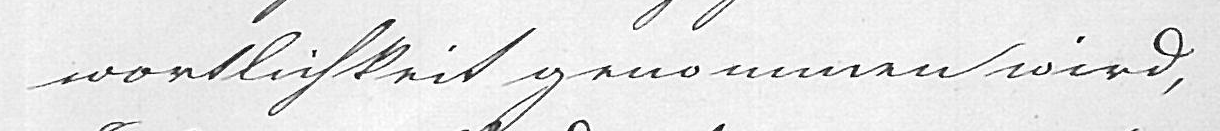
wortlichkeit genommen wird,
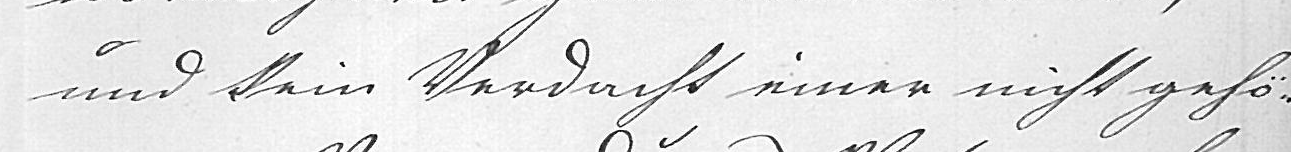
und kein Verdacht einer nicht gehö-
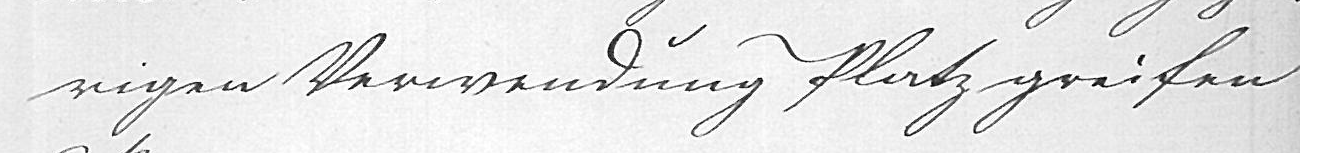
rigen Verwendung Platz greifen
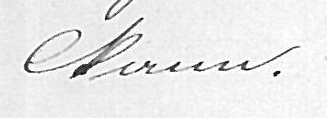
kann.
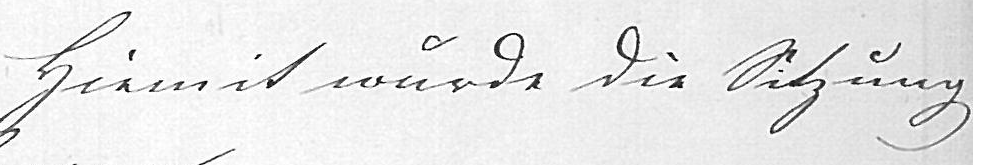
Hiemit wurde die Sitzung
